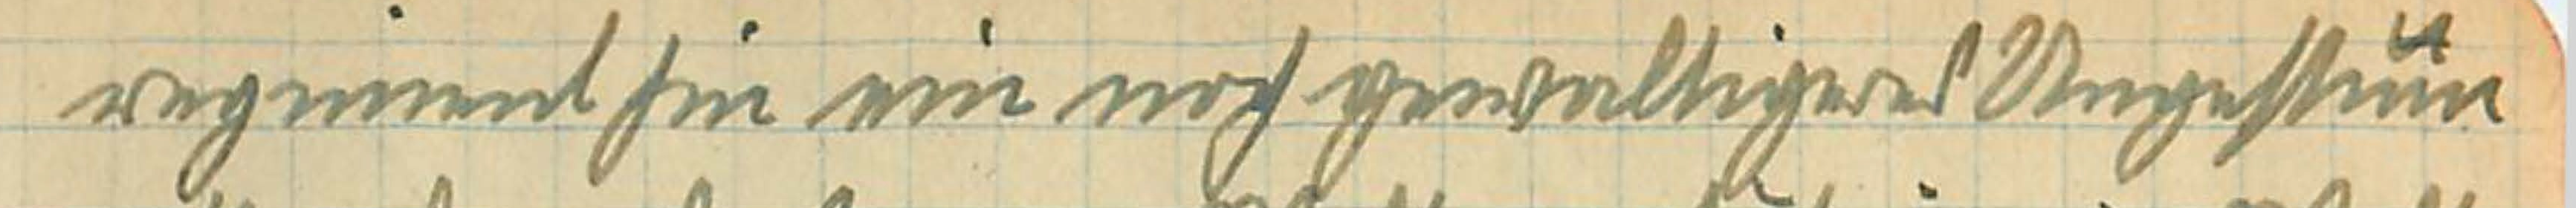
regiment hin ein noch gewaltigeres Ungestüm
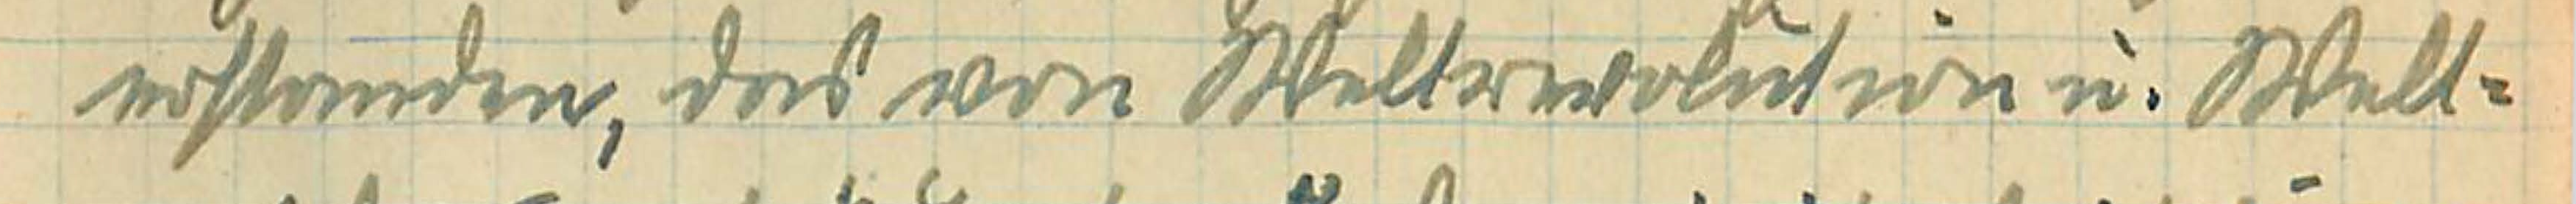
erstanden, das von Weltrevolution u. Welt-
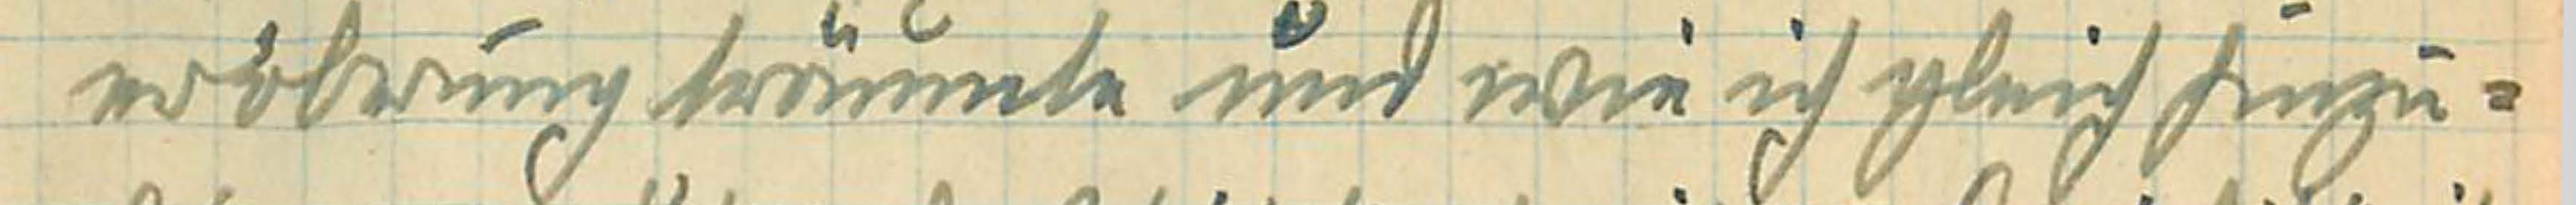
eroberung träumte und wie ich gleich hinzu-
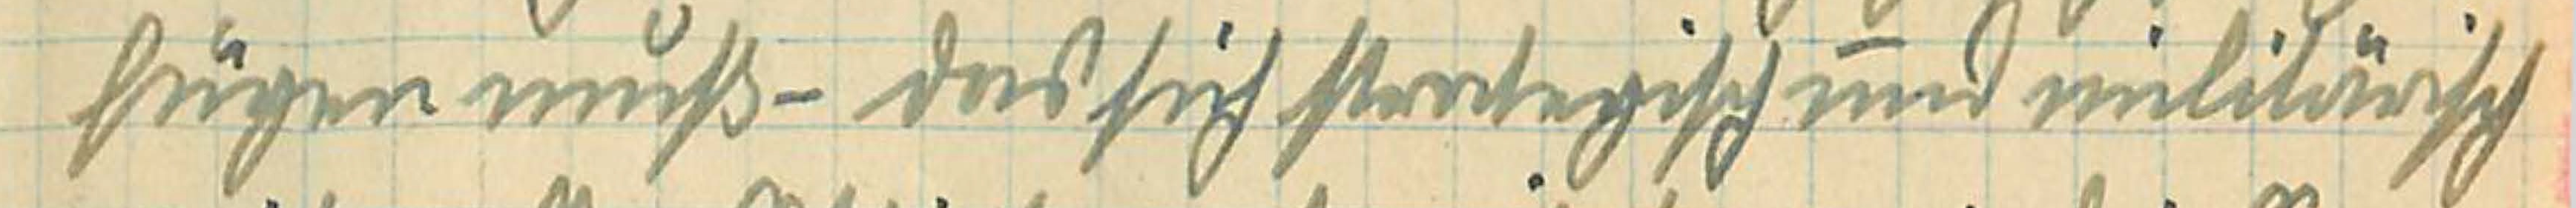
fügen muß – das sich strategisch und militärisch
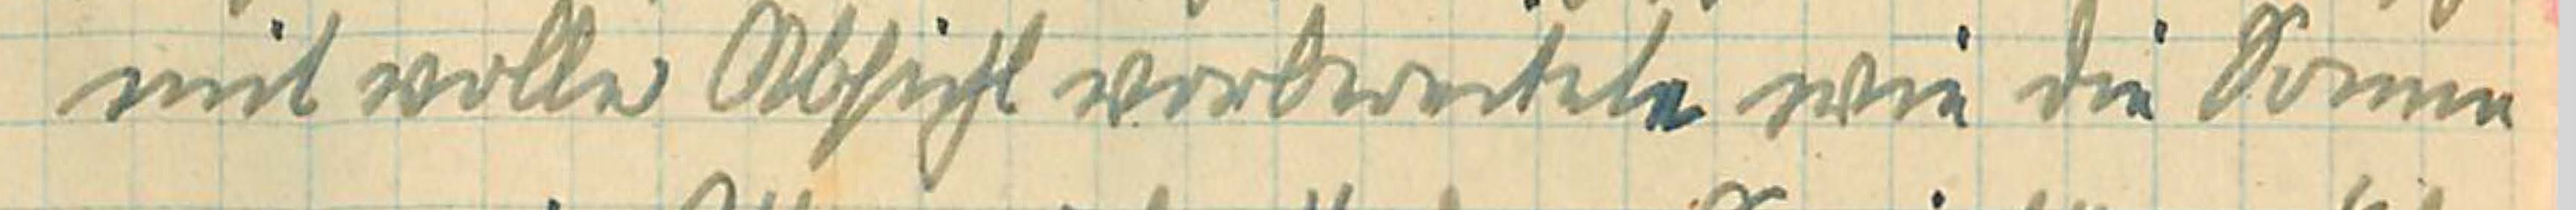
mit voller Absicht vorbereitete wie die Sonne
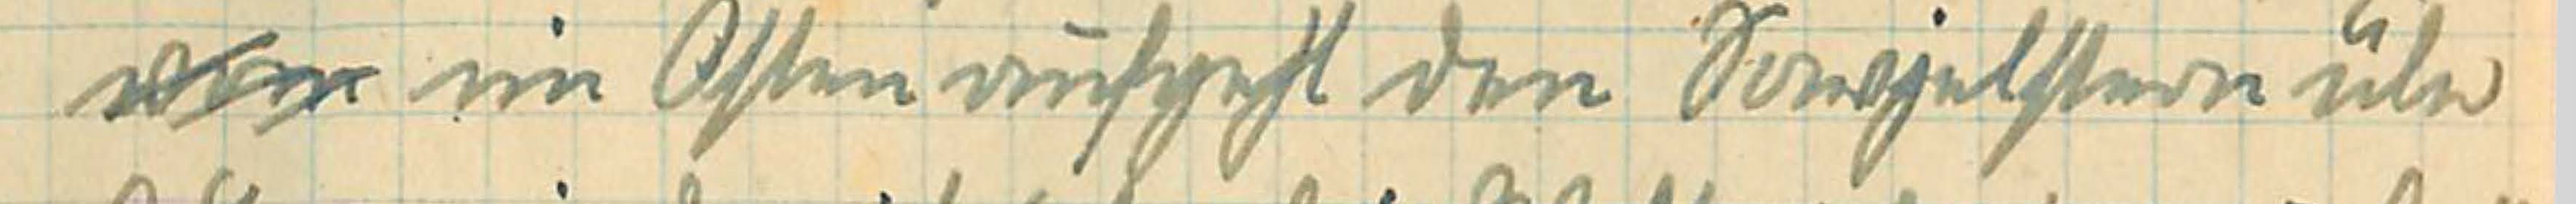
vom im Osten aufgeht den Sowjetstern über
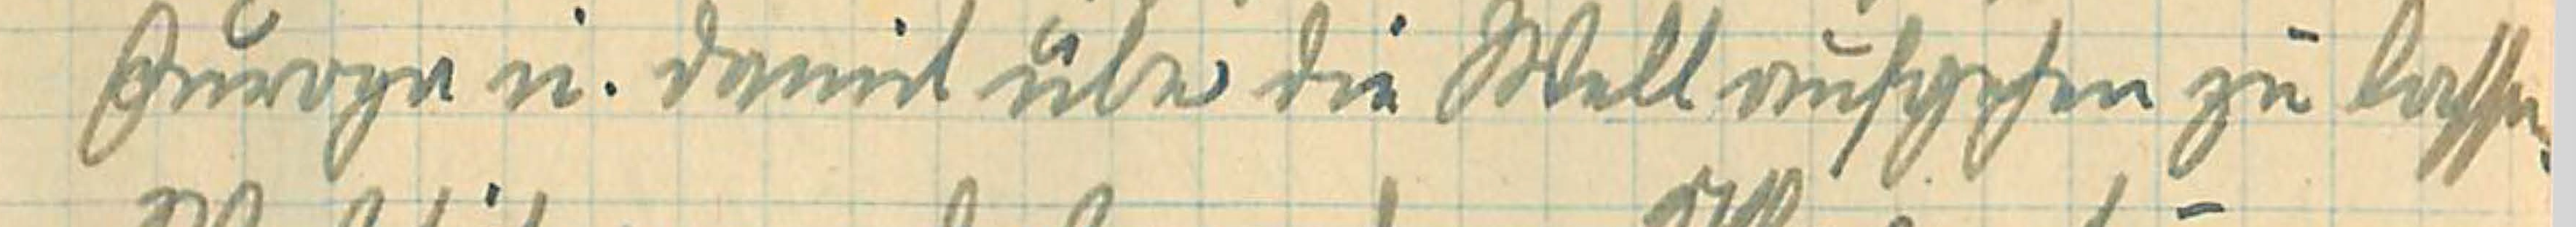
Europa u. damit über die Welt aufgehen zu lassen.
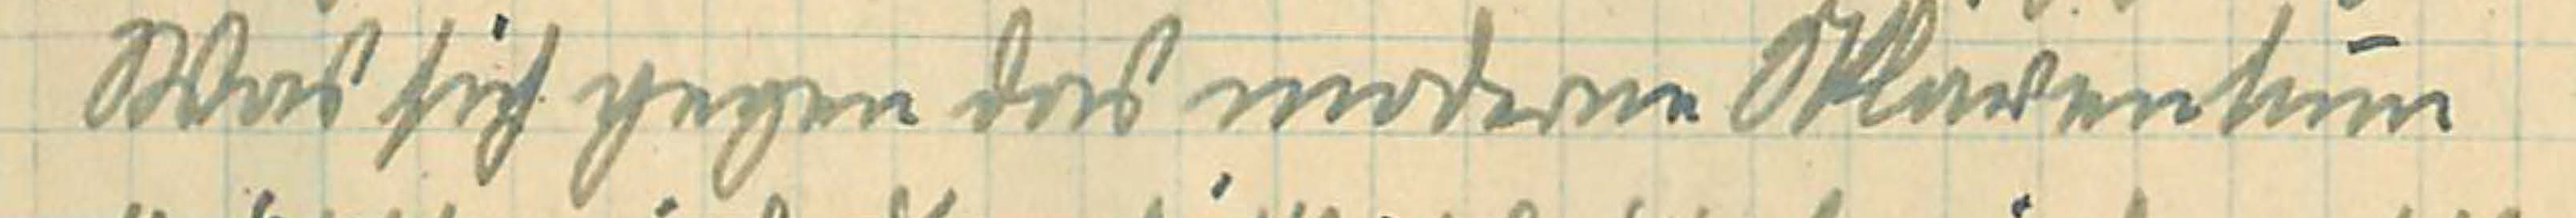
Was sich gegen das moderne Sklaventum
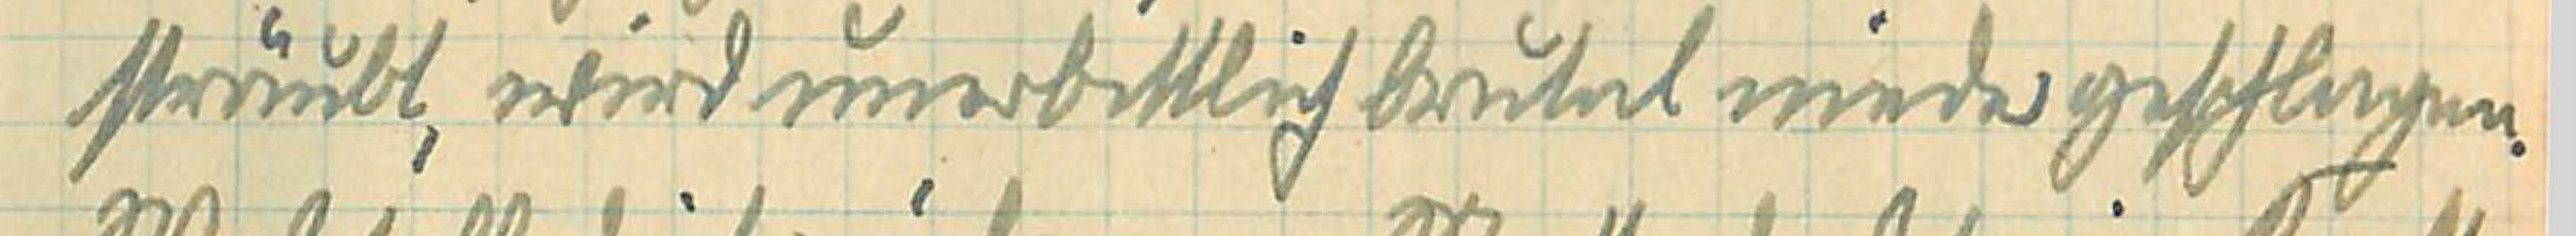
sträubt, wird unerbittlich brutal nieder geschlagen.
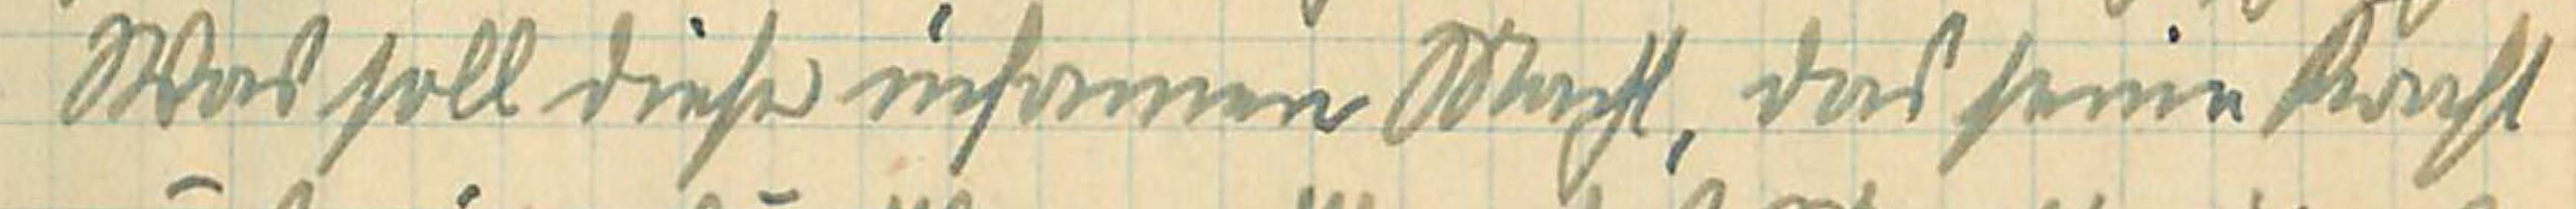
Was soll dieser infamen Macht, das seine Kraft
